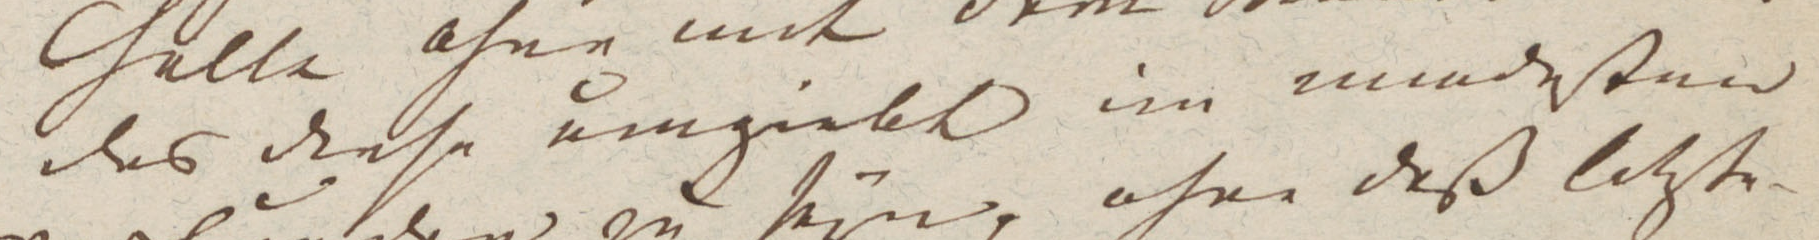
das diese umgiebt im mindesten
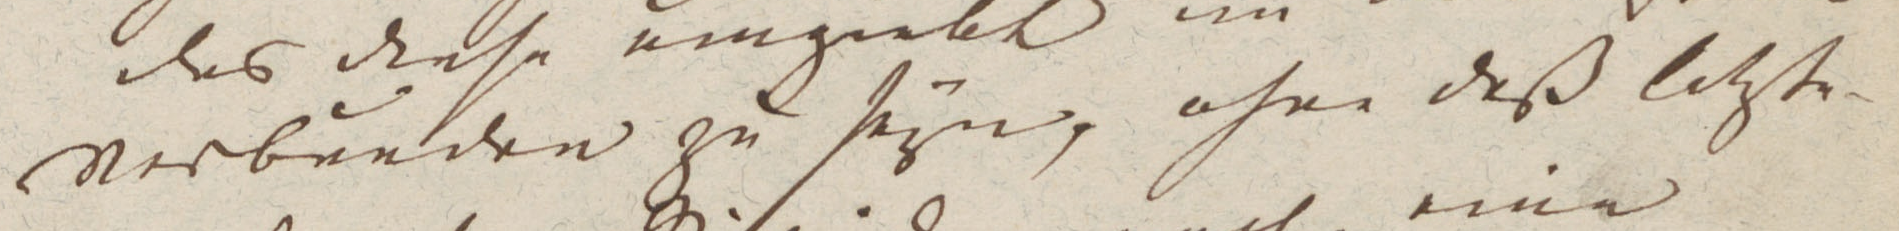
verbunden zu seyn, ohne dass letzte-
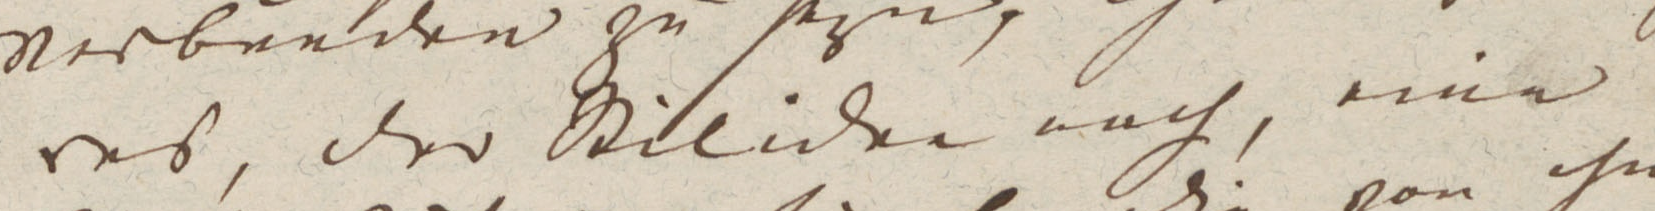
res, der Stilidee nach, eine
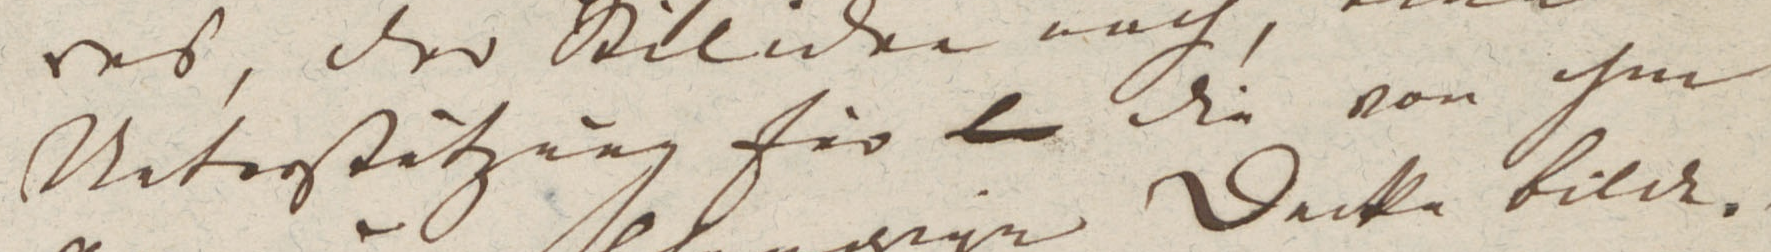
Unterstützung für die von ihm
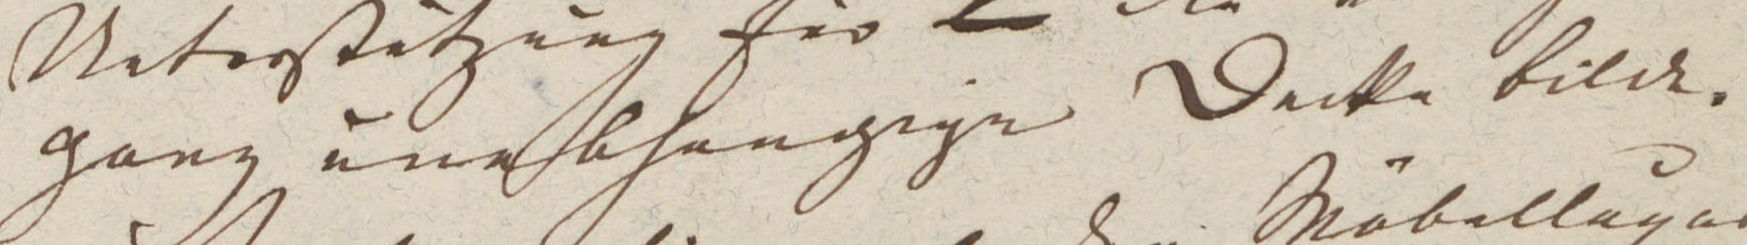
ganz unabhangige Decke bilde. –
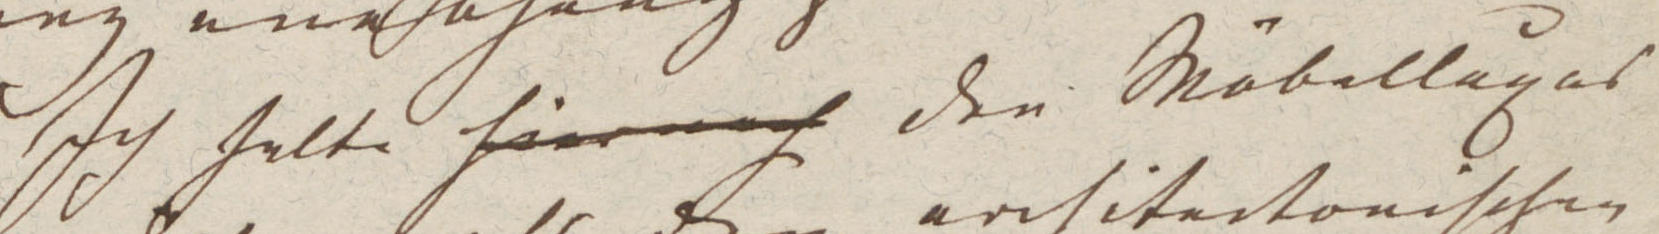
Ich halte hiernach den Möbelluxus
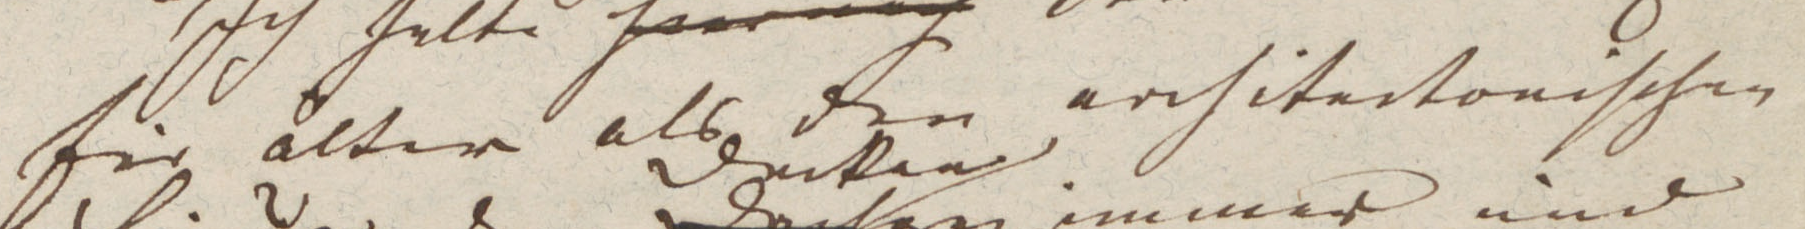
für älter als den architectonischen
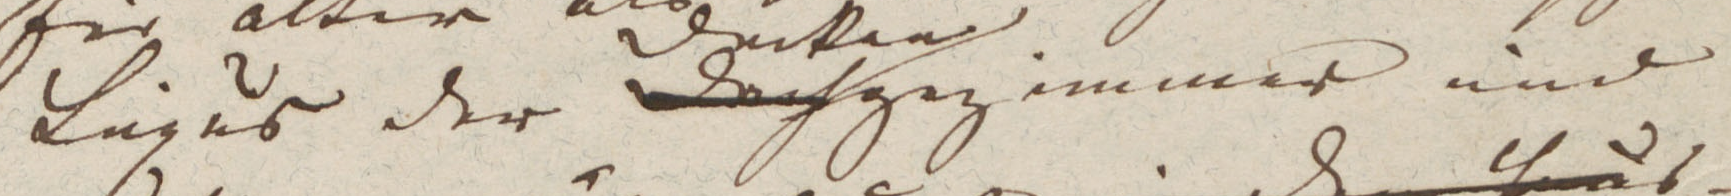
Luxus der DachDeckengezimmer und
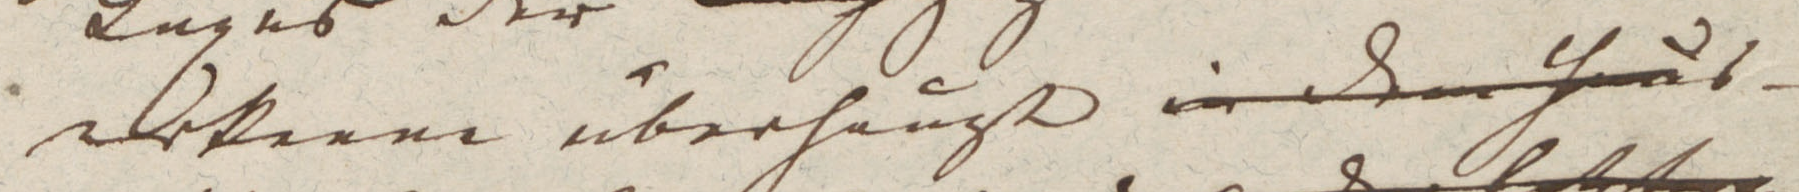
erkenne überhaupt in dem Haus-
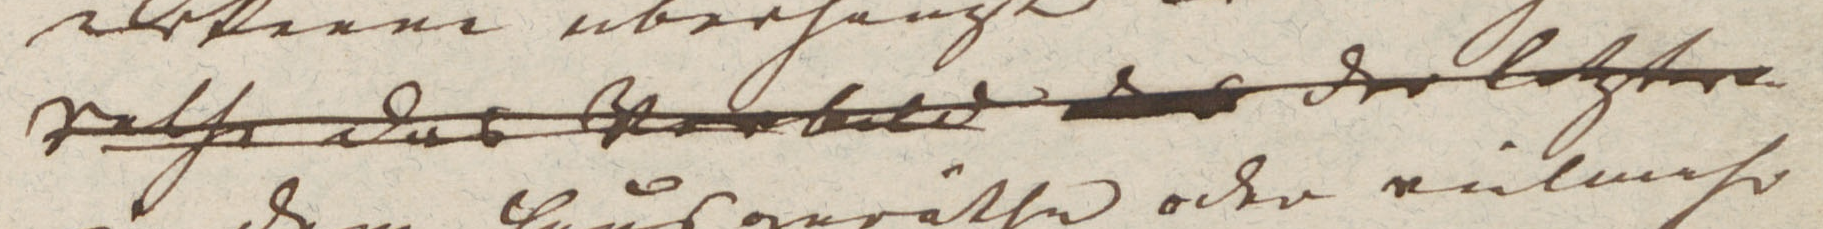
rathe das Vorbild des der letztere
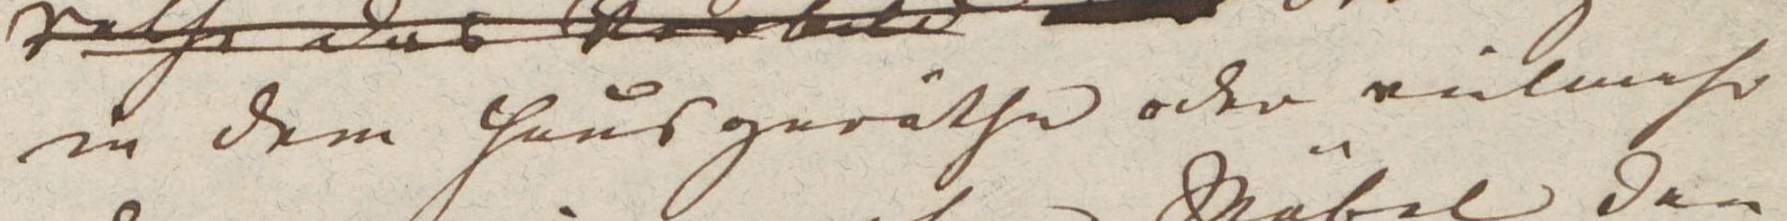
in dem Hausgeräthe oder vielmehr
